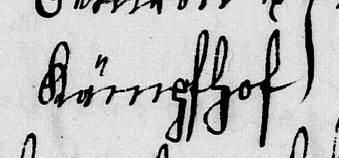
Kämpfhof
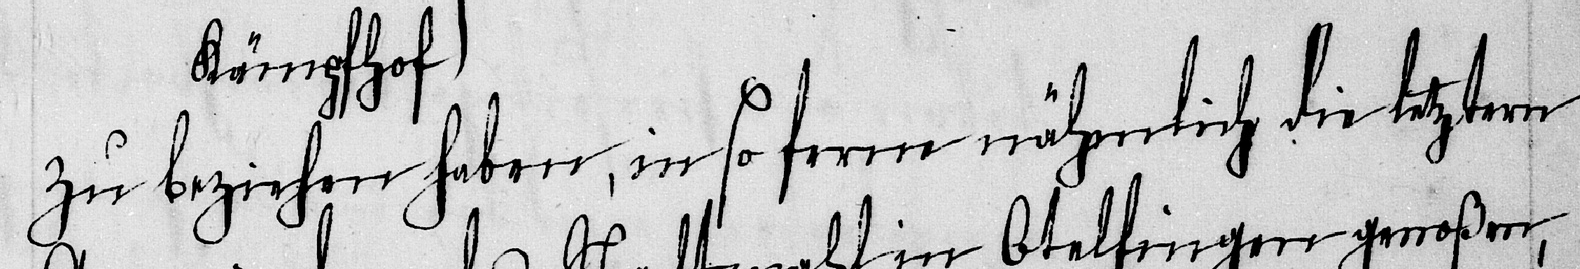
zu beziehen haben, in soferne nähmlich die letztern
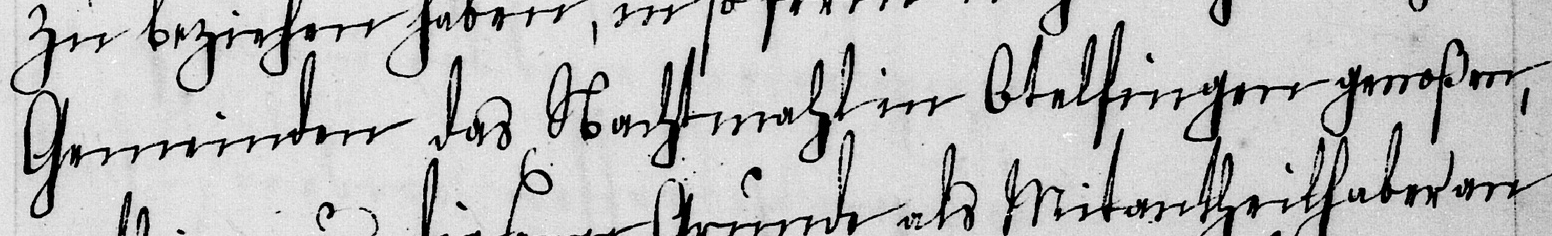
Gemeinden das Nachtmahl in Otelfingen genoßen,
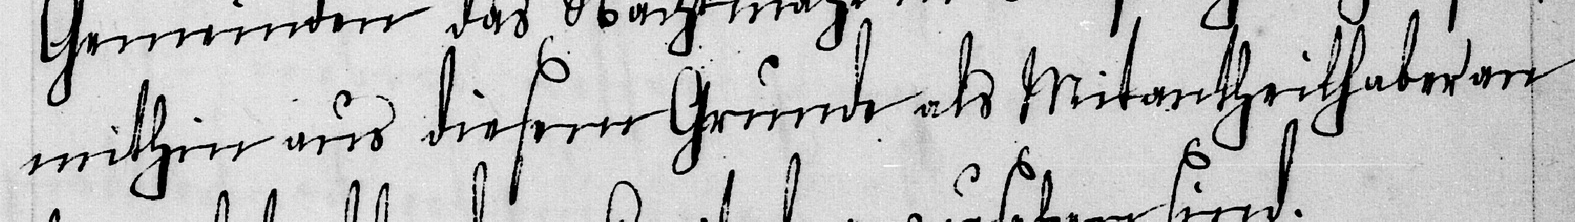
mithin aus diesem Grunde als Mitantheilhaber an
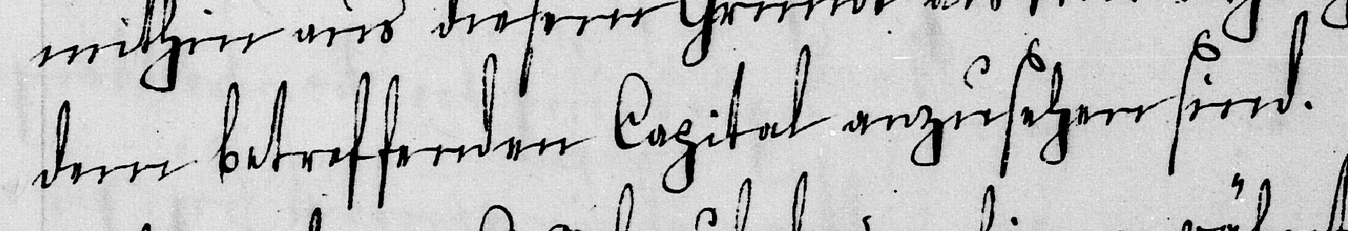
dem betreffenden Capital anzusehen sind.
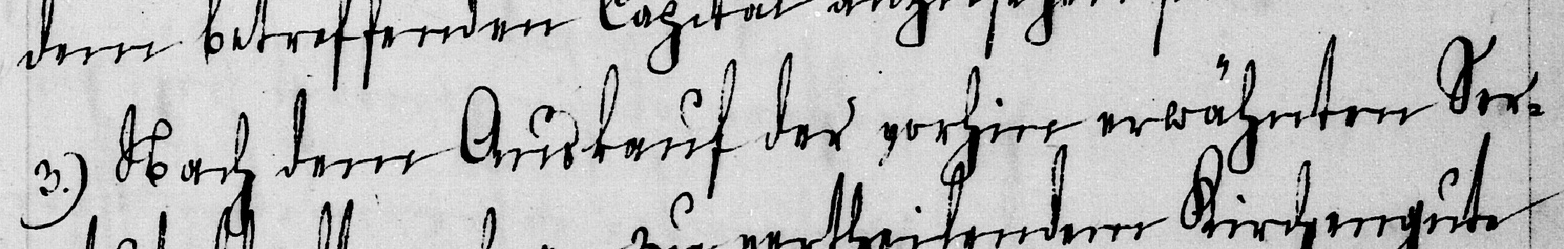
3.) Nach dem Auskauf der vorhin erwähnten Ser¬
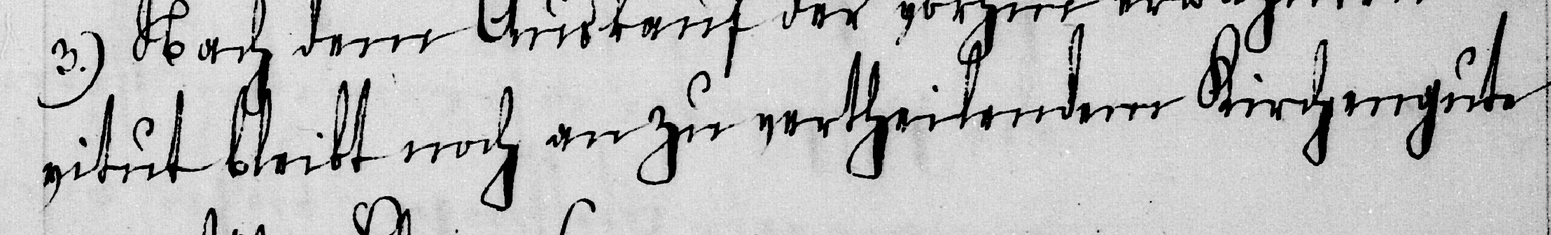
vitut bleibt noch an zu vertheilendem Kirchengute
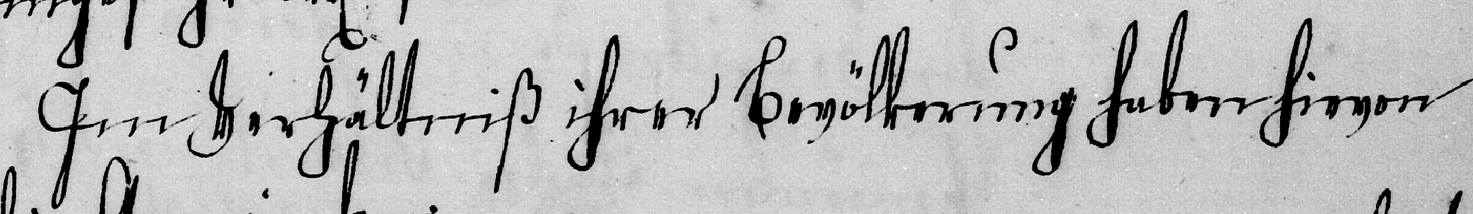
Im Verhältniß ihrer Bevölkerung haben hievon
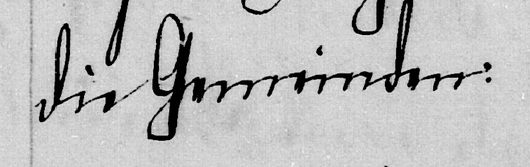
die Gemeinden:
